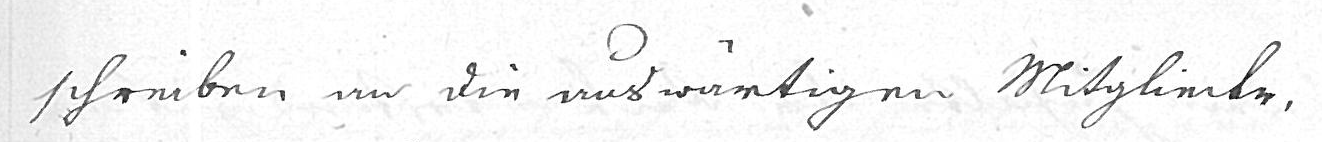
schreiben an die auswärtigen Mitglieder,
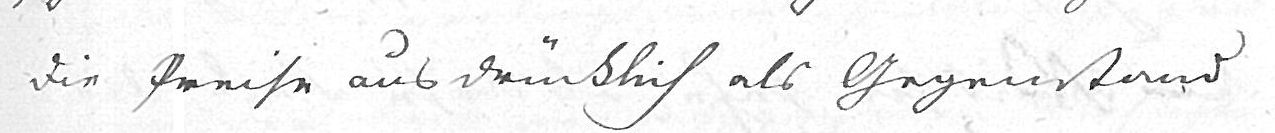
die Preise ausdrücklich als Gegenstand
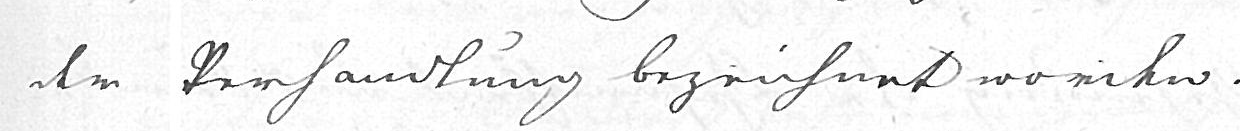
der Verhandlung bezeichnet worden.
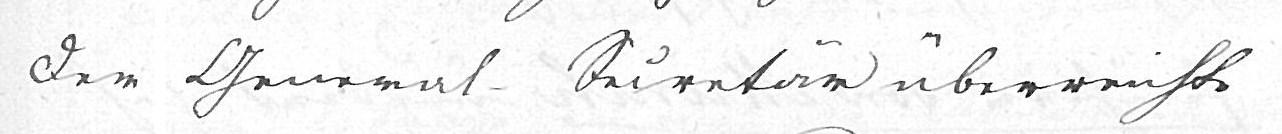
Der General-Secretär überreichte
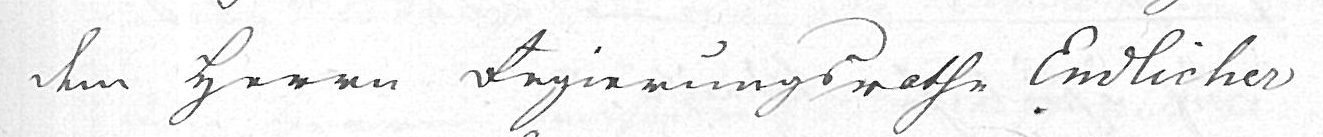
dem Herrn Regierungsraht Endlicher
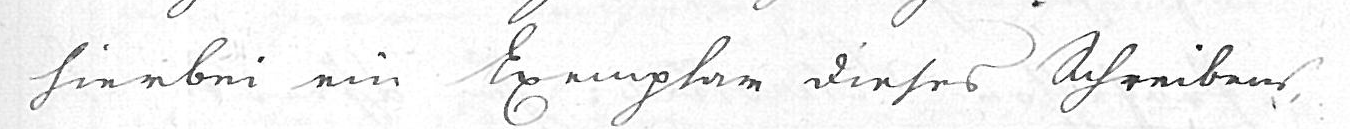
hierbei ein Exemplar dieses Schreibens,
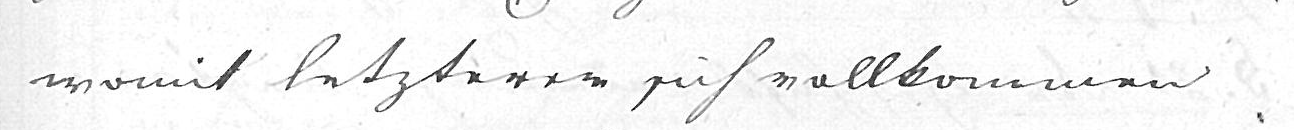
womit letzterer sich vollkommen
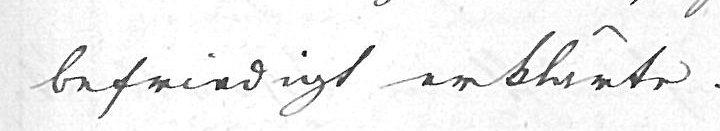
befriedigt erklärte.
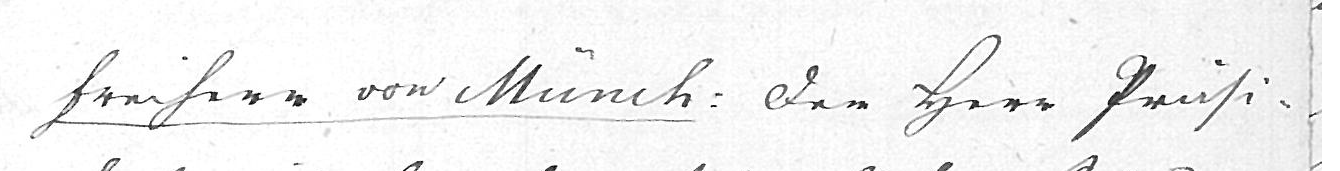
Freiherr von Münch: Der Herr Präsi-
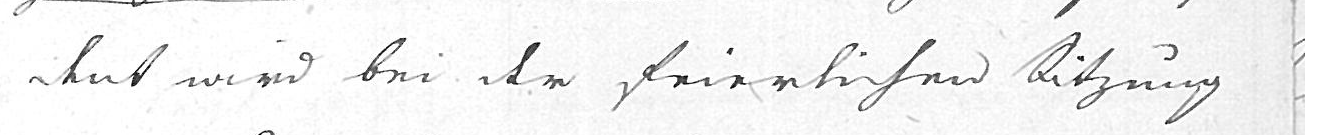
dent wird bei der feierlichen Sitzung
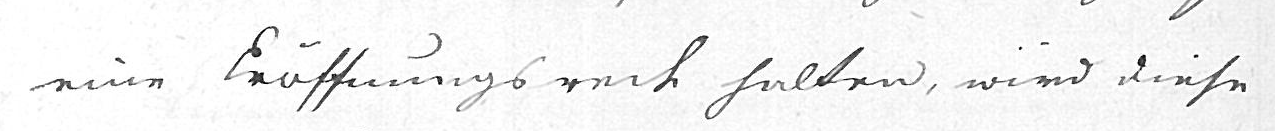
eine Eröffnungsrede halten, wird diese
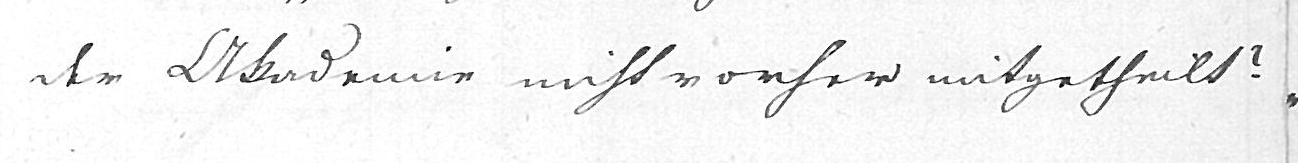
der Akademie nicht vorher mitgetheilt?
